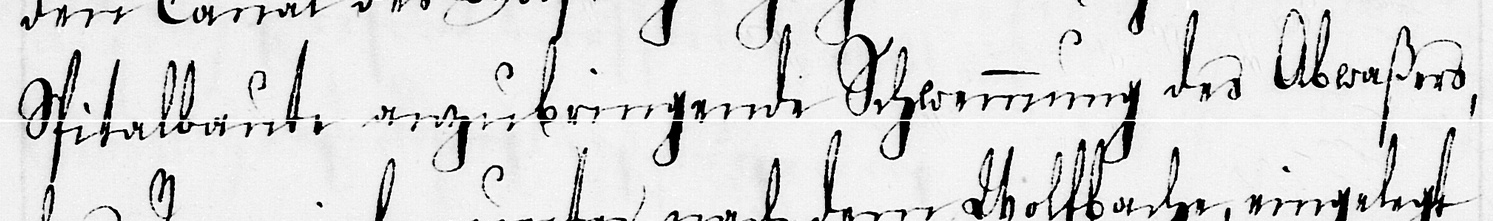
Spitalbaute anzubringende Schwemmung des Abwaßers,
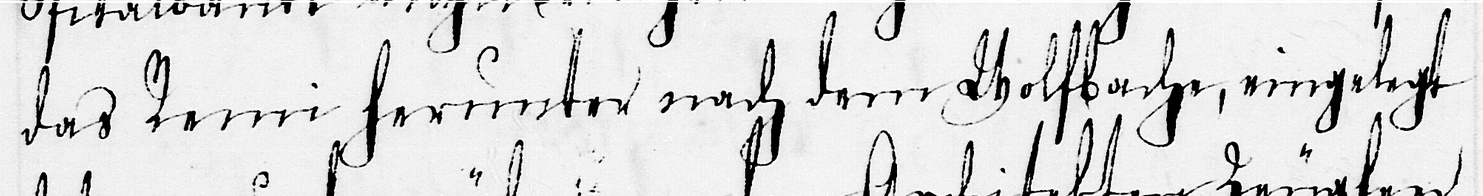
das Remi herunter nach dem Wolfbache, eingelegt
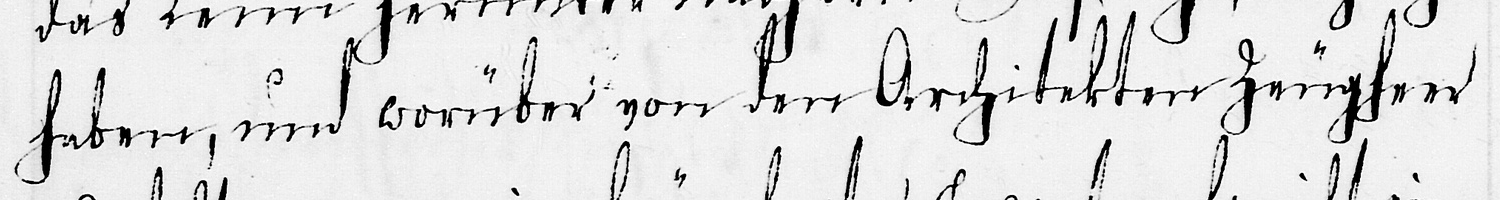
haben, und worüber von den Architekten Zeugheer
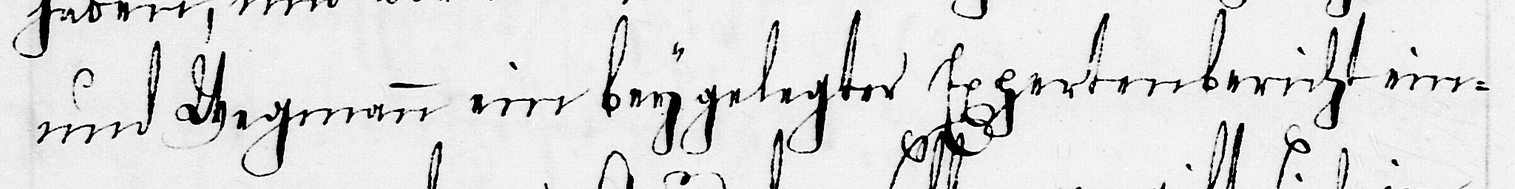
und Wegmann ein beygelegter Expertenbericht ein¬
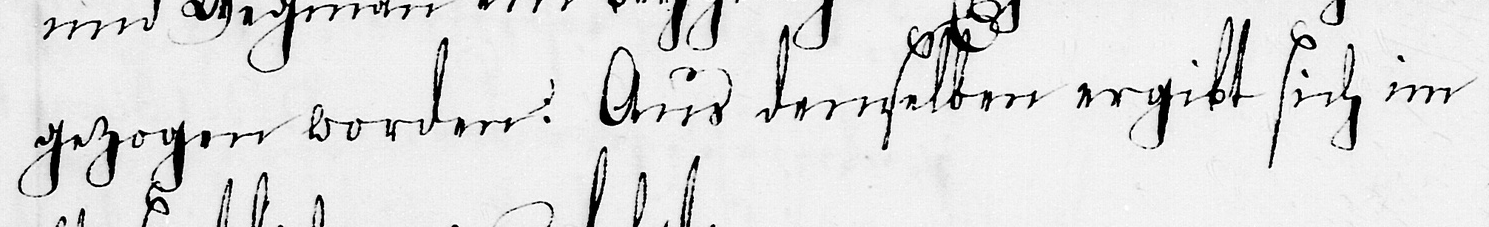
gezogen worden. Aus demselben ergibt sich im
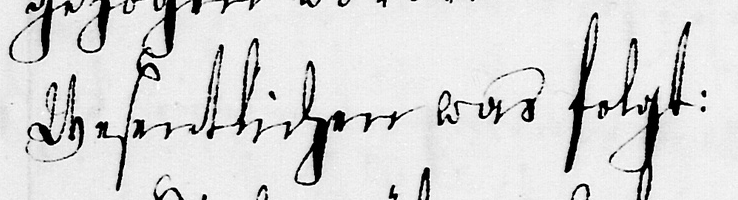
Wesentlichen was folgt:
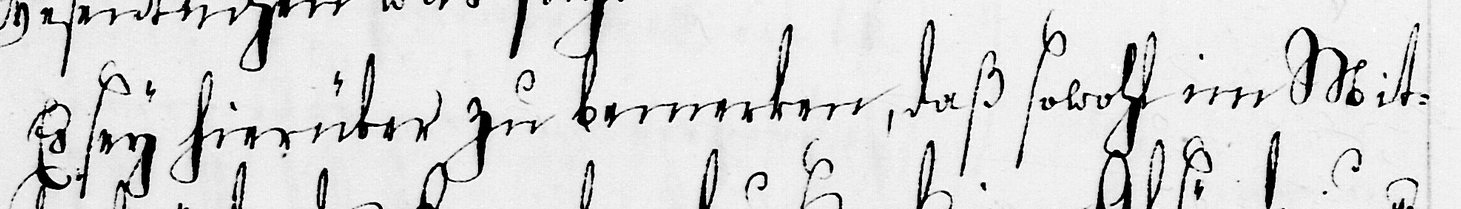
Es sey hierüber zu bemerken, daß sowohl im Mit¬
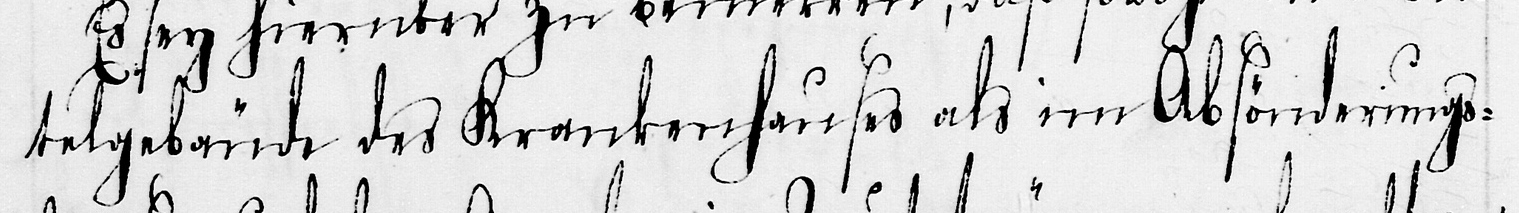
telgebäude des Krankenhauses als im Absönderungs¬
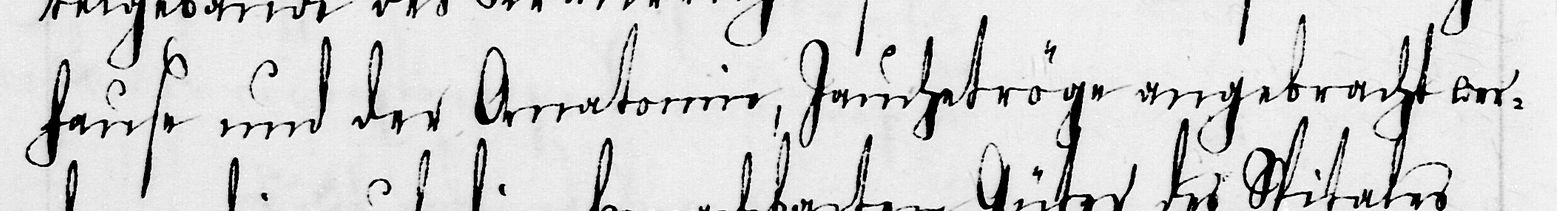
hause und der Anatomie, Jauchetröge angebracht wer¬
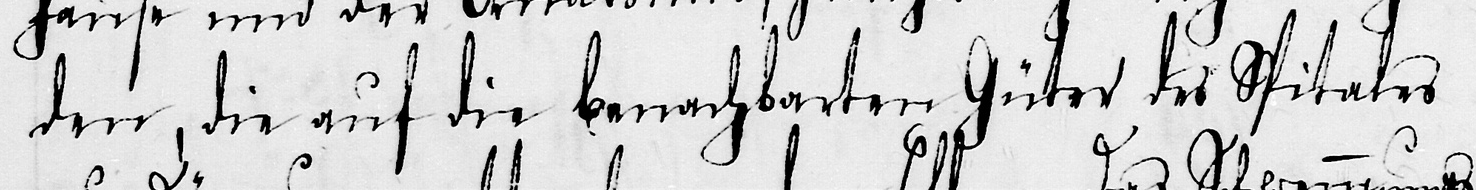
den, die auf die benachbarten Güter des Spitales
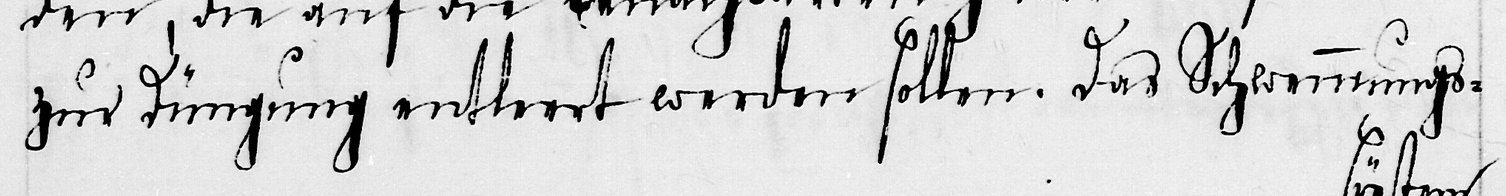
zur Düngung entleert werden sollen. Das Schwemmungs-
